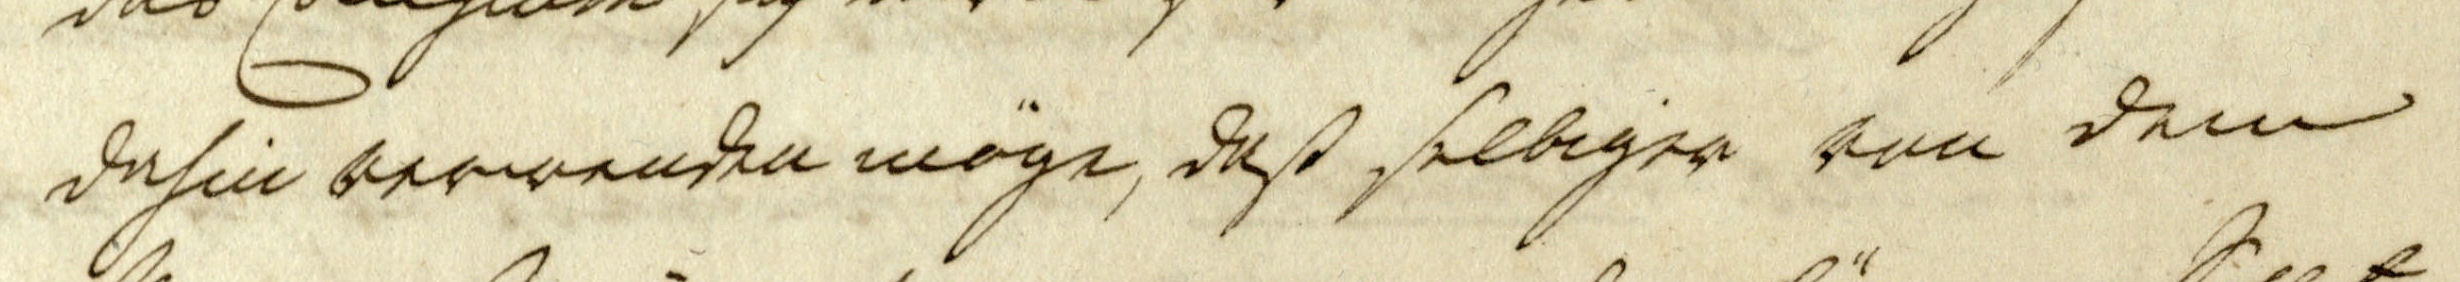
dahin verwenden möge, daß selbiger von dem
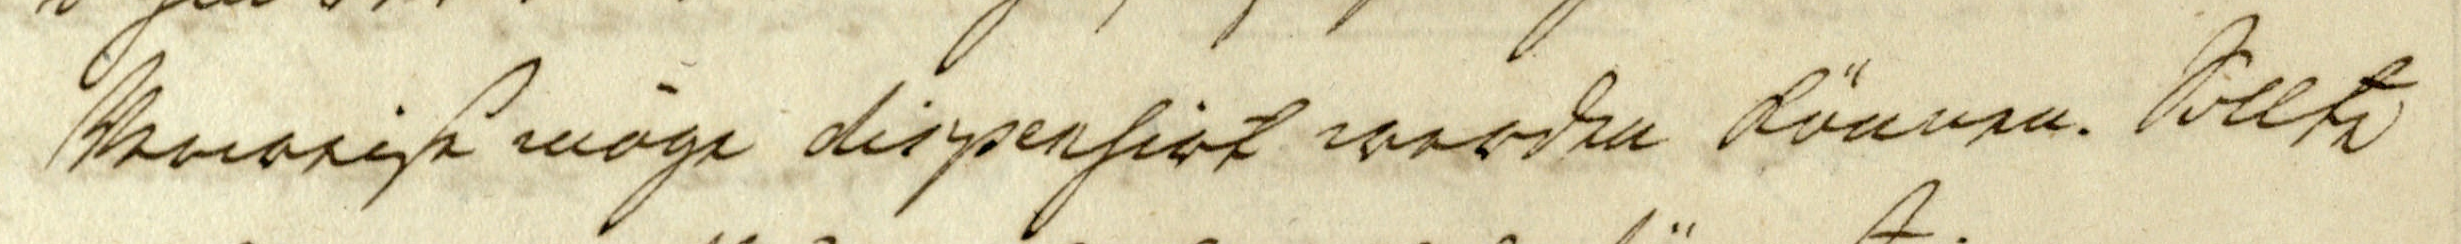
Verweise möge dispensirt werden können. Sollte
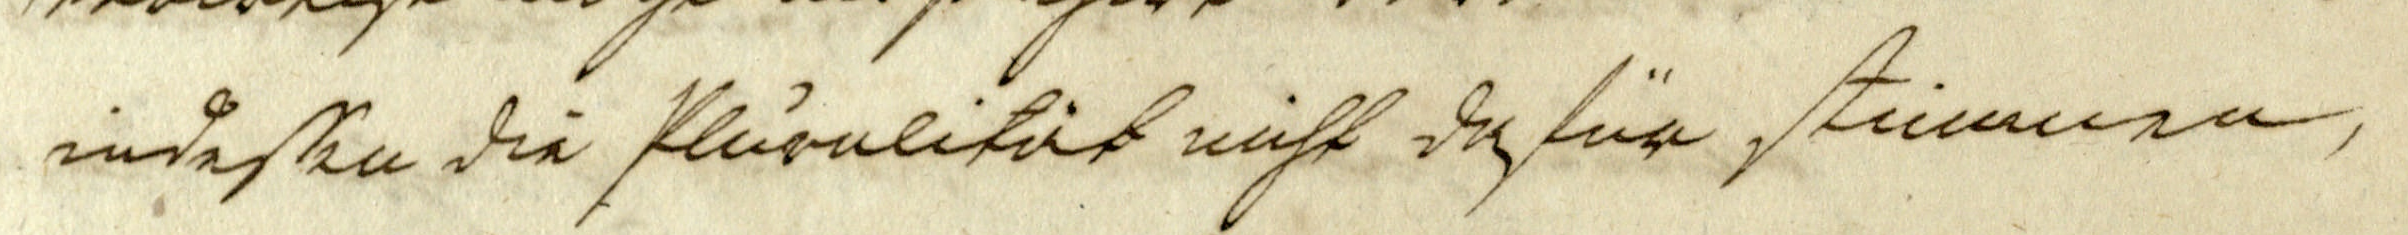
indessen die Pluralität nicht dafür stimmen,
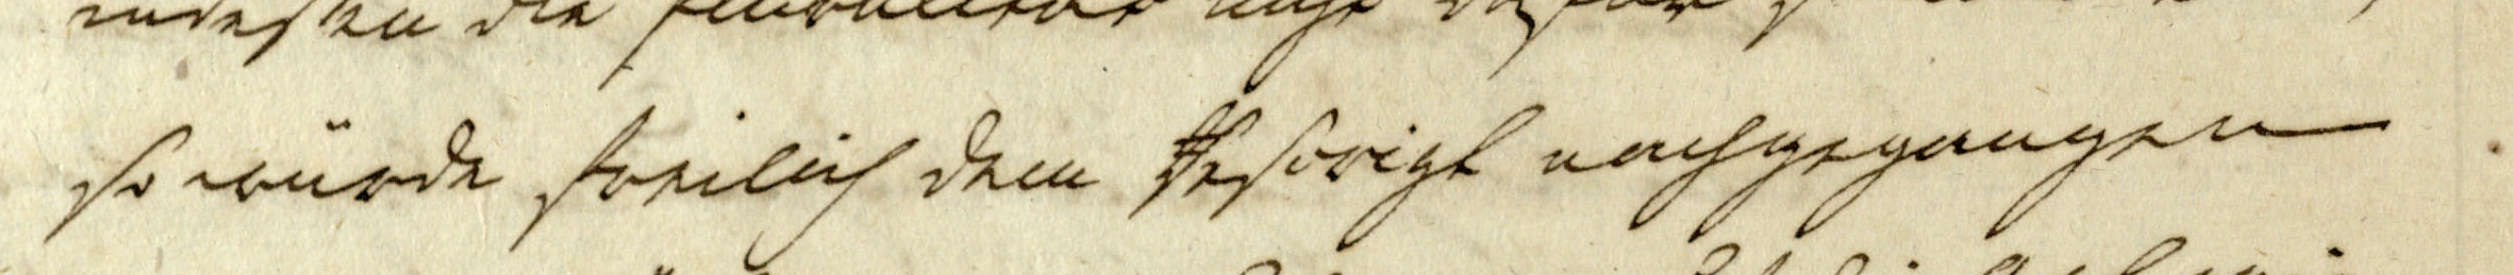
so würde freilich dem Rescript nachgegangen
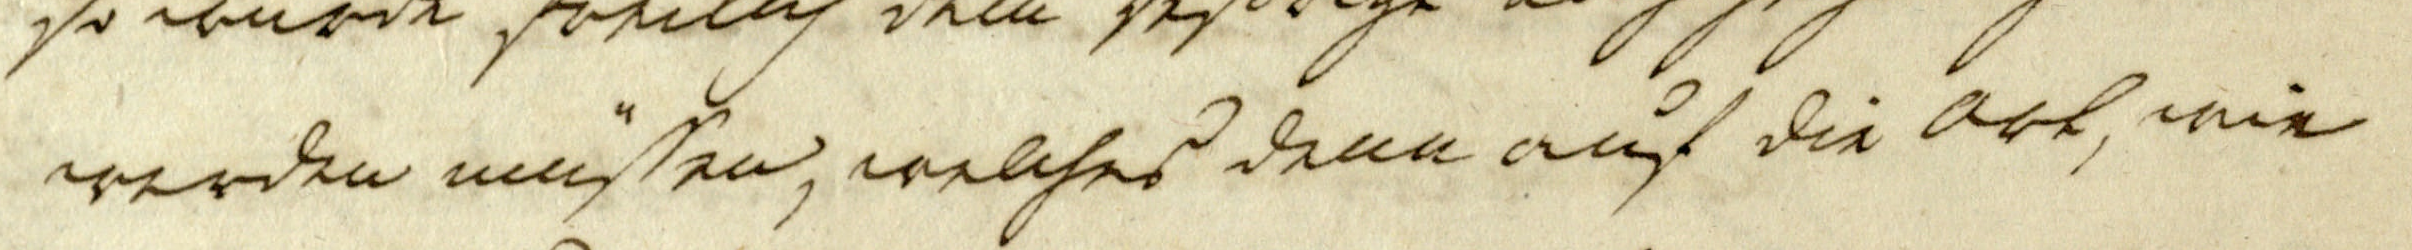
werden müssen, welches denn auf die Art, wie
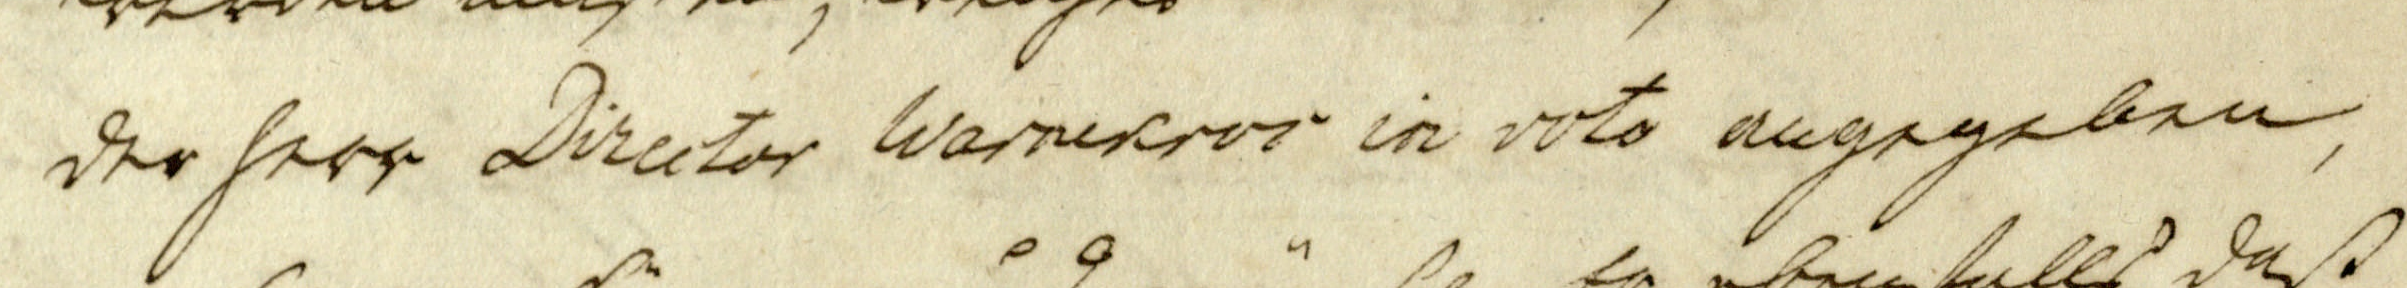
der herr Director Warnekros in voto angegeben,
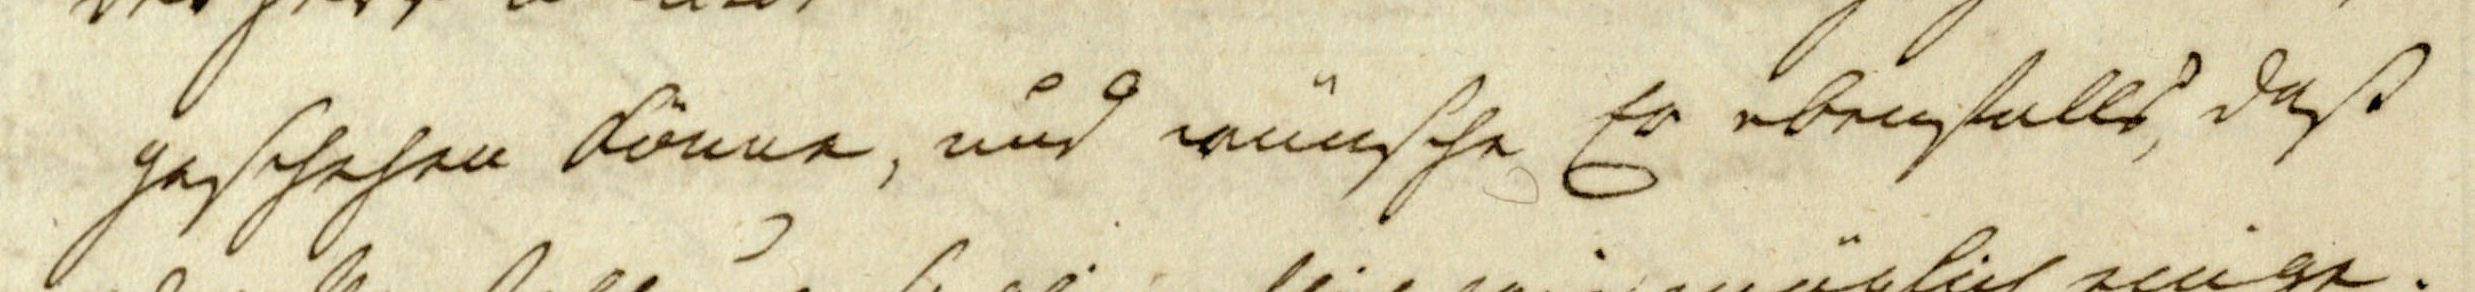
geschehen könne, und wünsche Er ebenfalls, daß
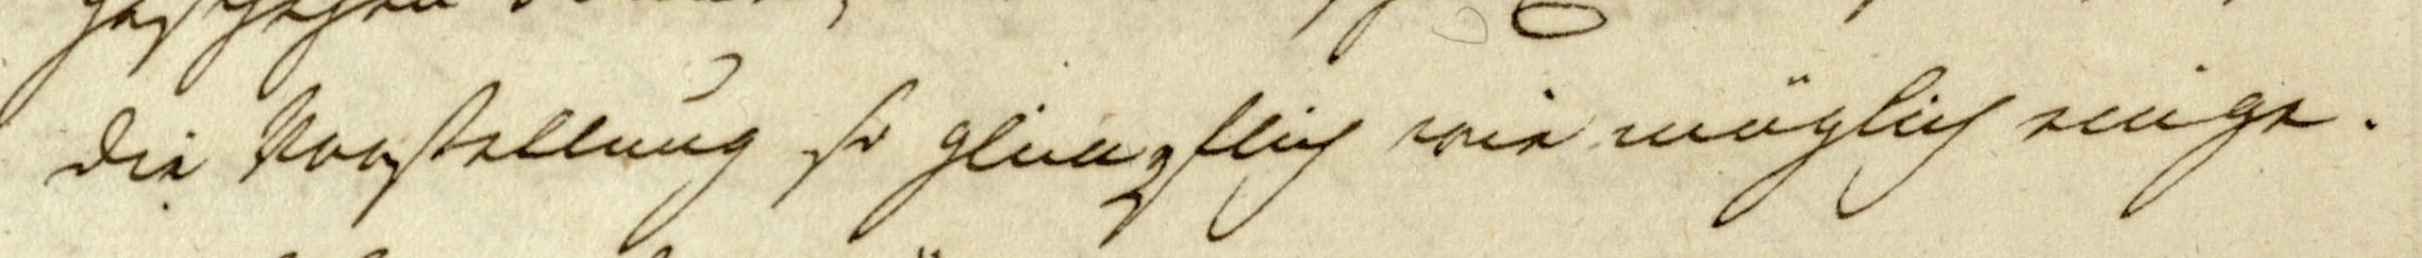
die Vorstellung so glimpflich wie möglich einge¬
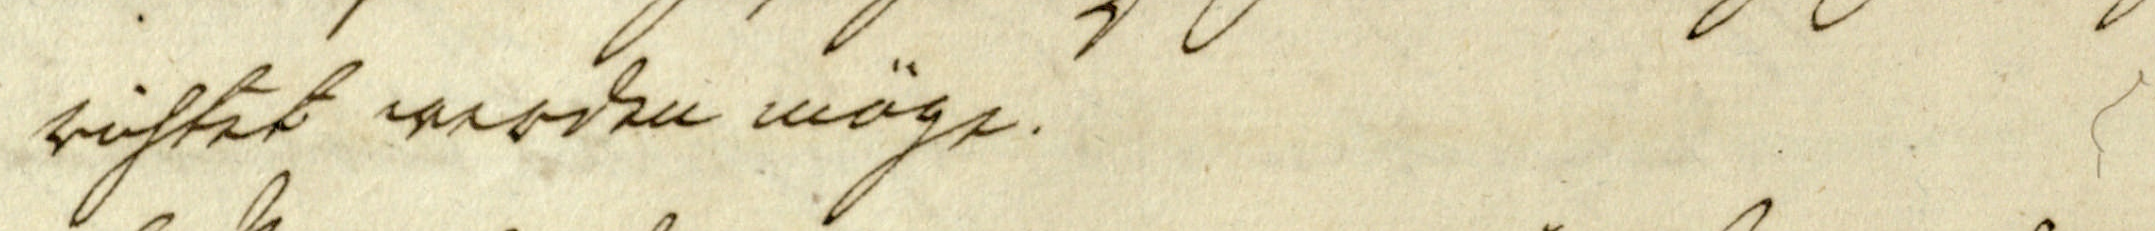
richtet werden möge.
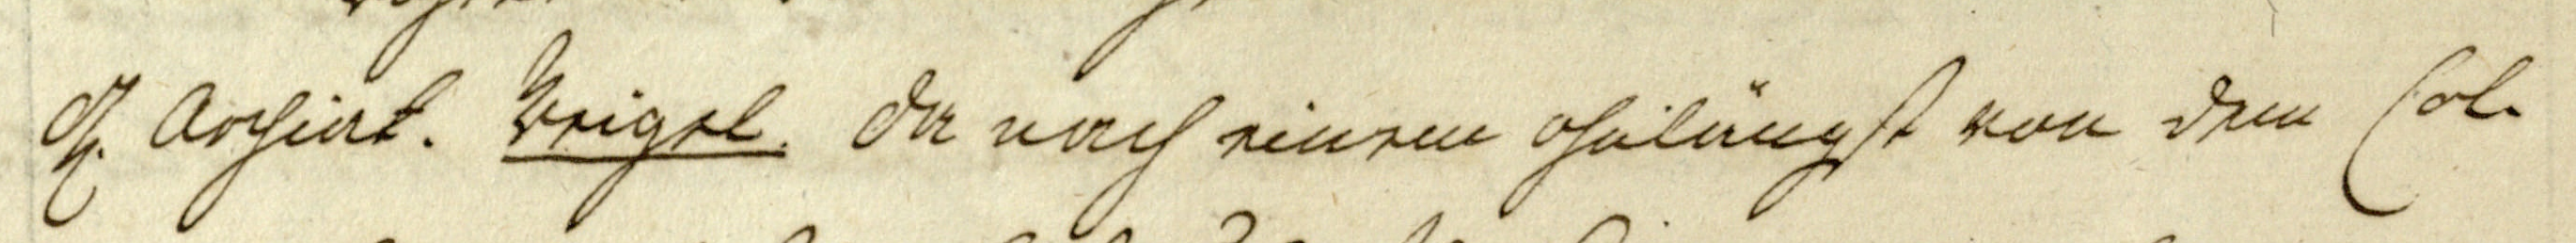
dh. Archiat. Weigel. Da nach einem ohnlängst von dem Col¬
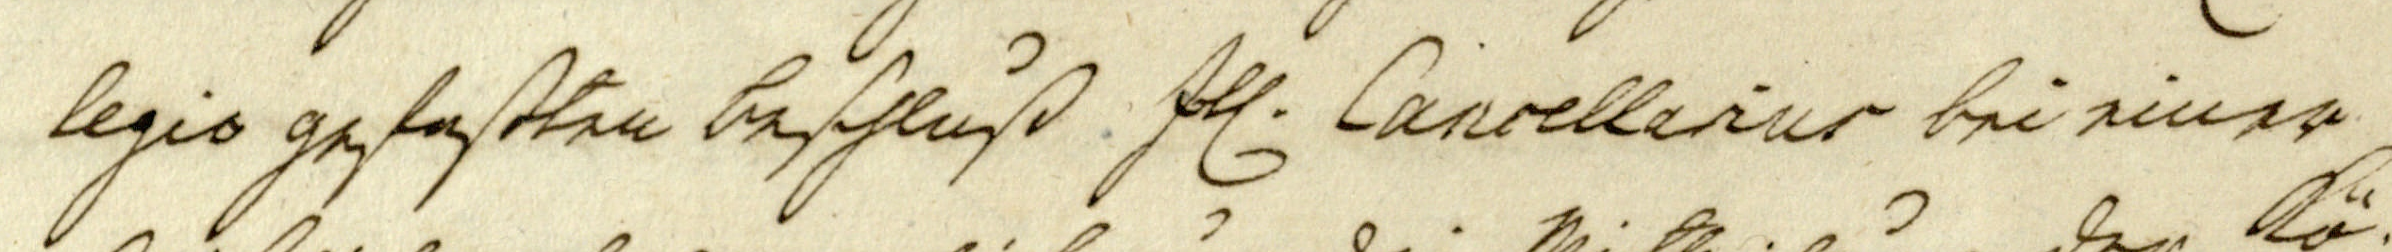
legio gefaßten Beschluß Ill. Cancellarius bei einer
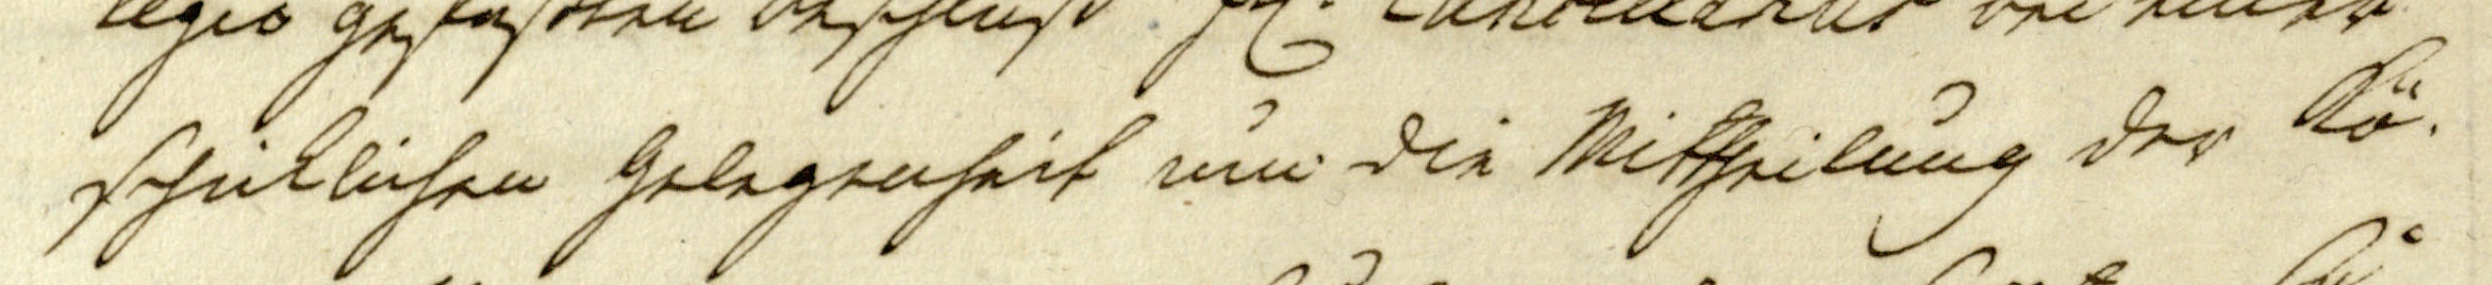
schicklichen Gelegenheit um die Mittheilung der Kö¬
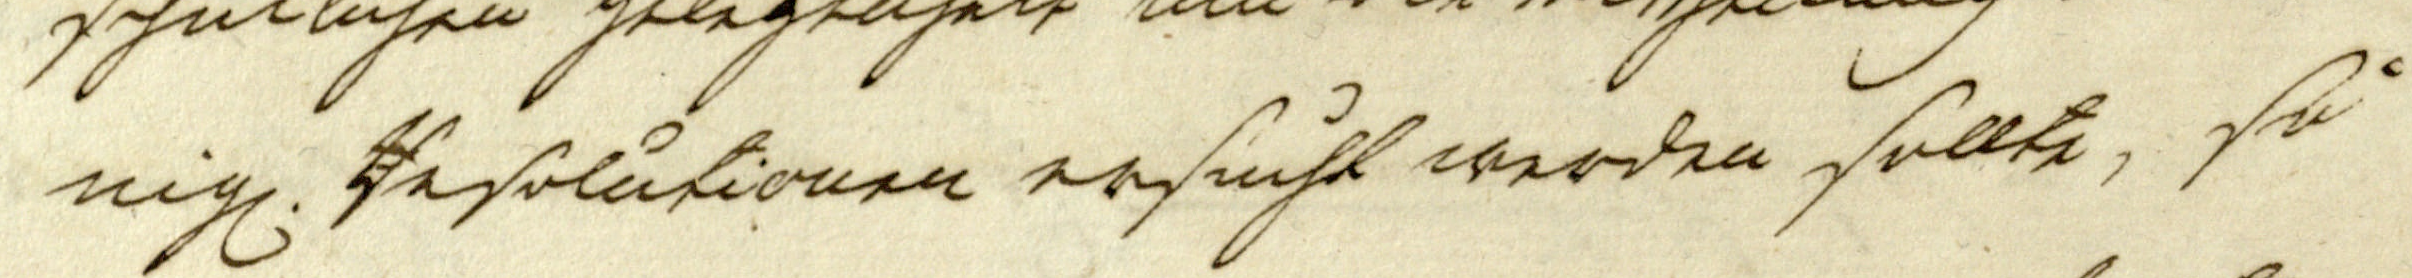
nigl. Resolutionen ersucht werden sollte, so
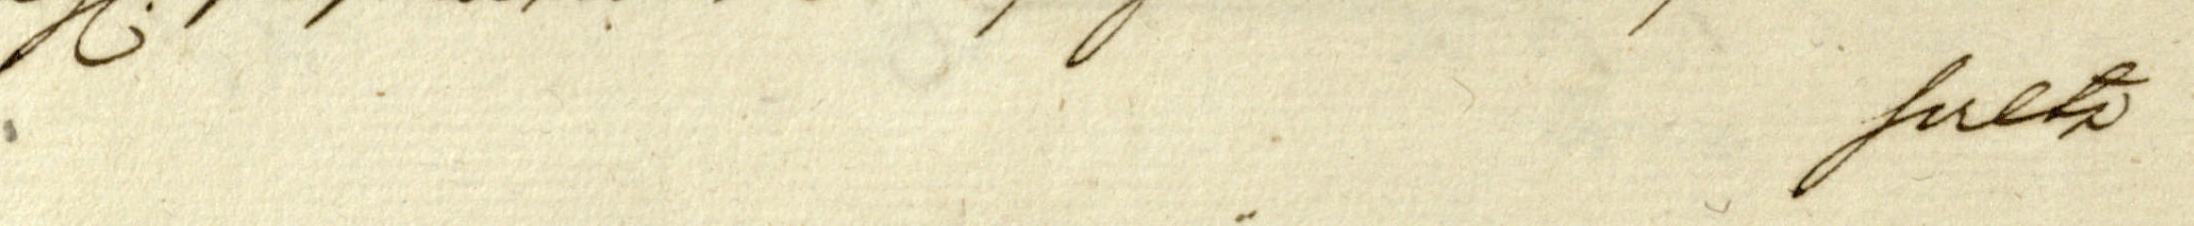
halte
